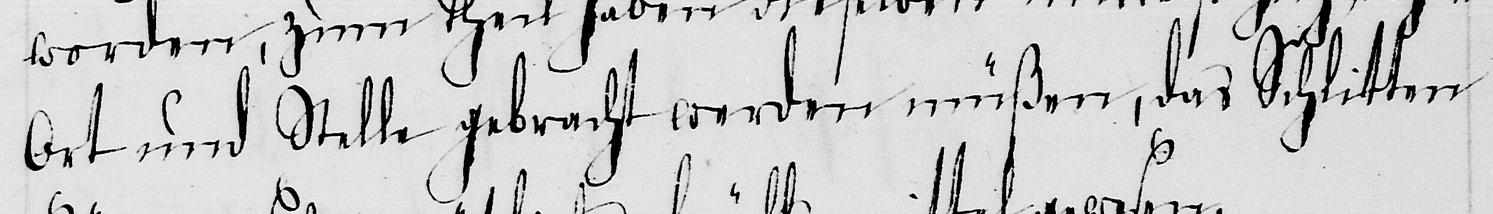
Ort und Stelle gebracht werden müßen, das Schlitten
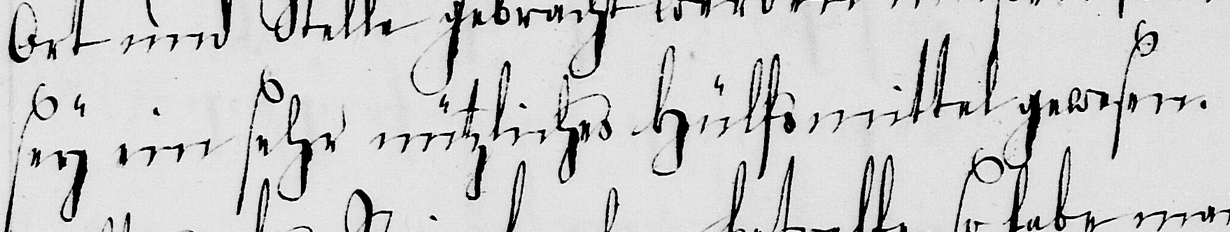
sey ein sehr nützliches Hülfsmittel gewesen.
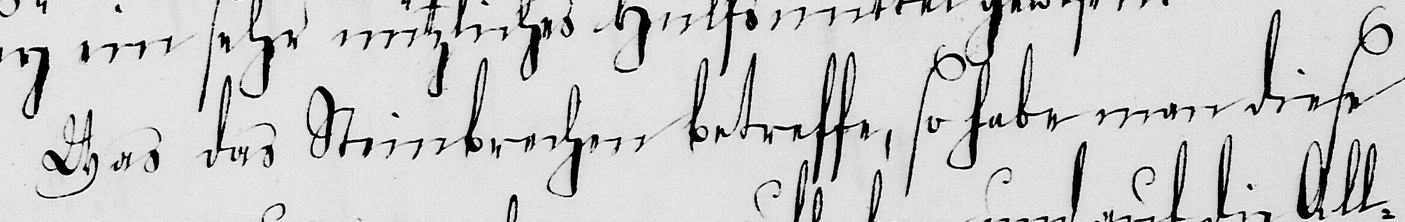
Was das Steinbrechen betreffe, so habe man diese
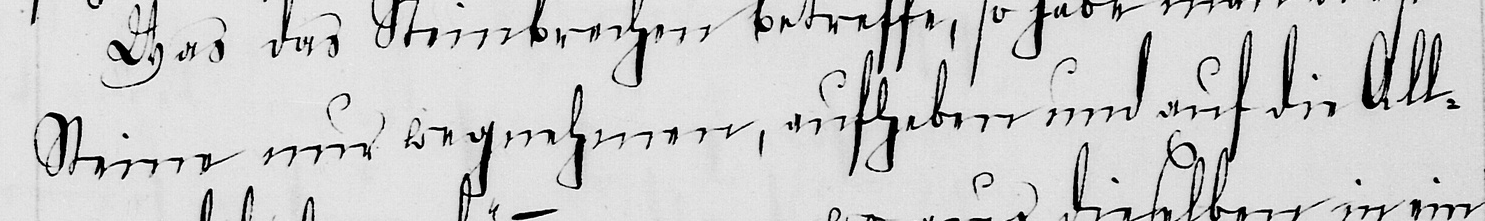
Steine nur wegnehmen, aufheben und auf die All¬
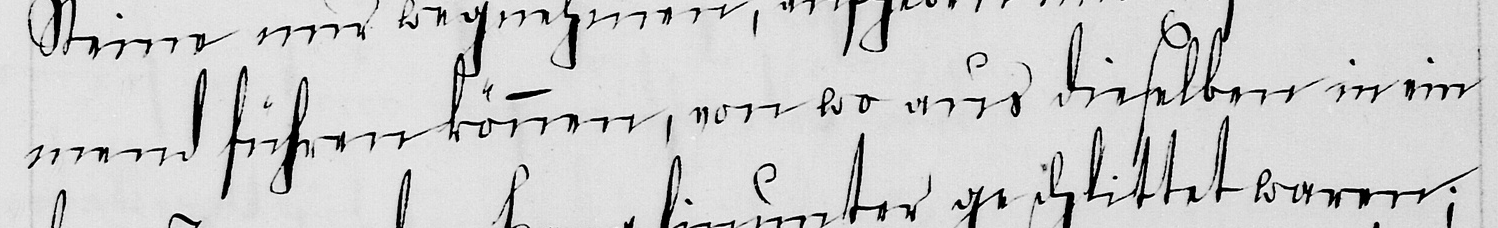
mend führen können, von wo aus dieselben in ein
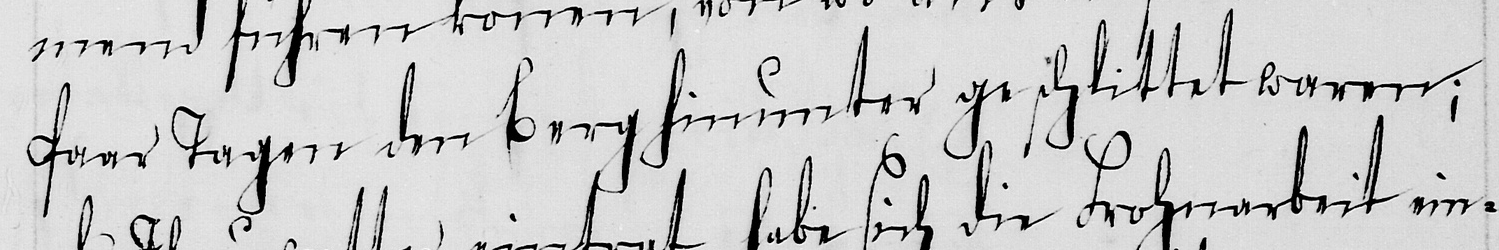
Paar Tagen den Berg hinunter geschlittet waren;
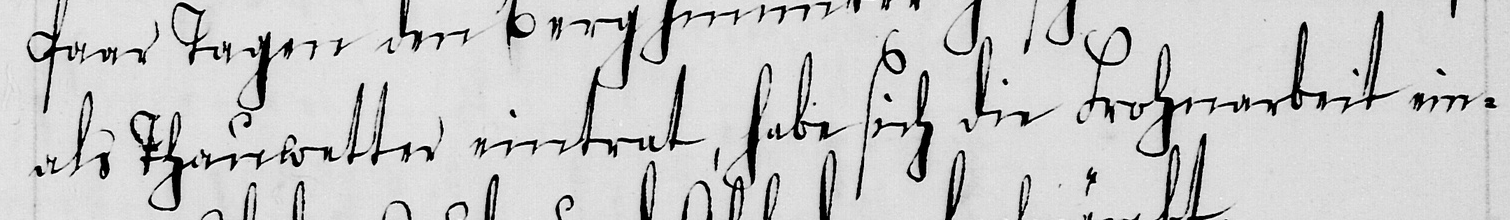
als Thauwetter eintrat, habe sich die Frohnarbeit ein¬
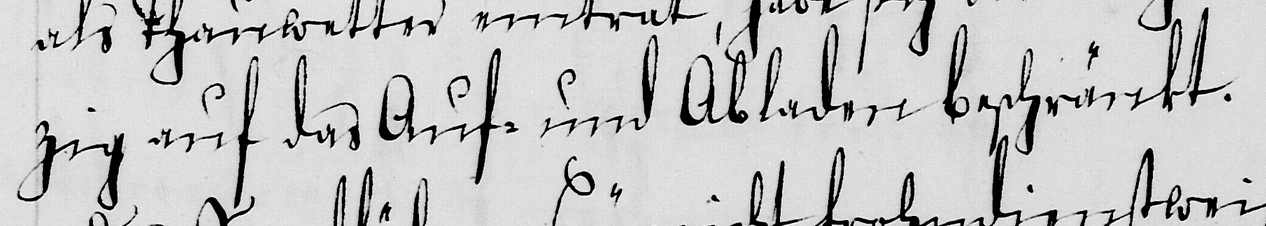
zig auf das Auf- und Abladen beschränkt.
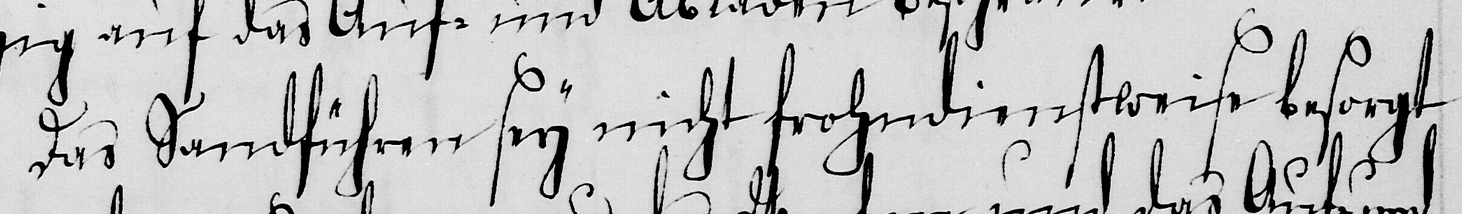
Das Sandführen sey nicht frohndienstweise besorgt
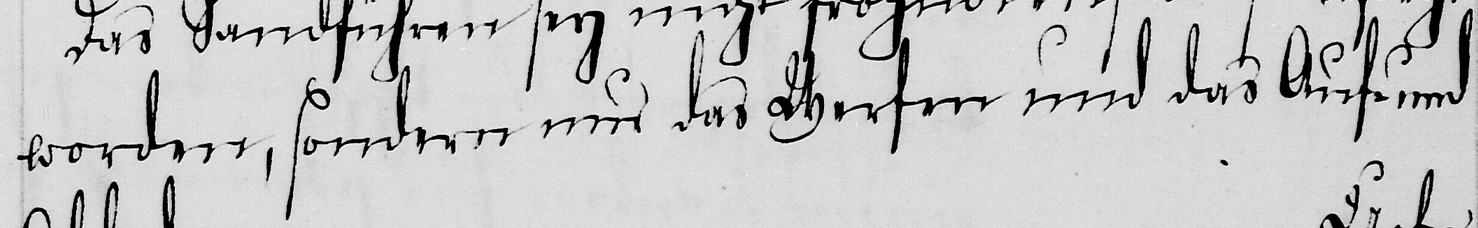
worden, sondern nur das Werfen und das Auf- und
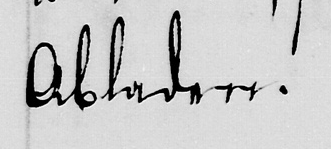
Abladen.
